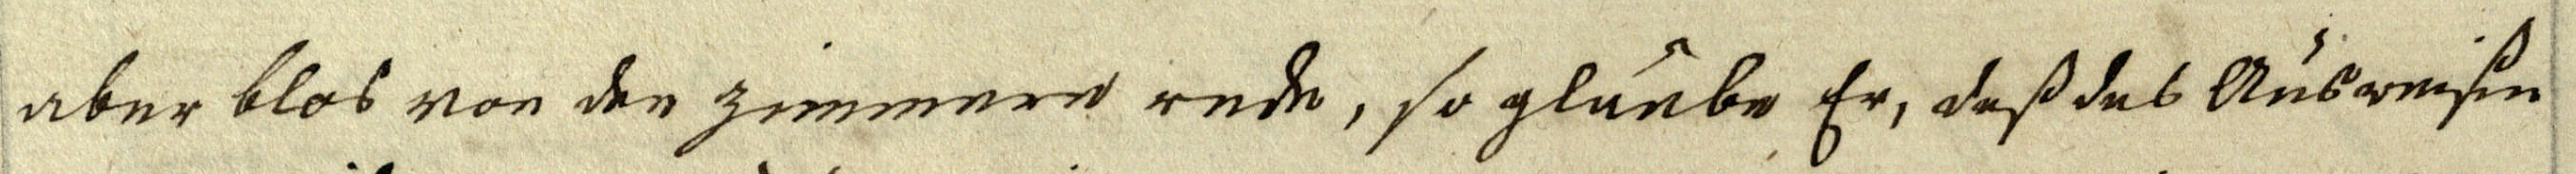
aber blos von den Zimmern rede, so glaube Er, daß das Ausweißen
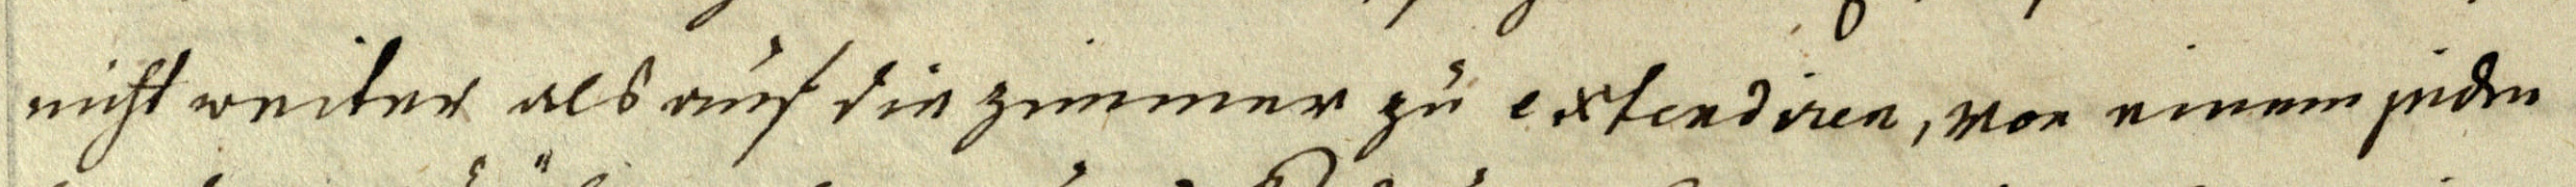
nicht weiter als auf die Zimmer zu extendiren, von einem jeden
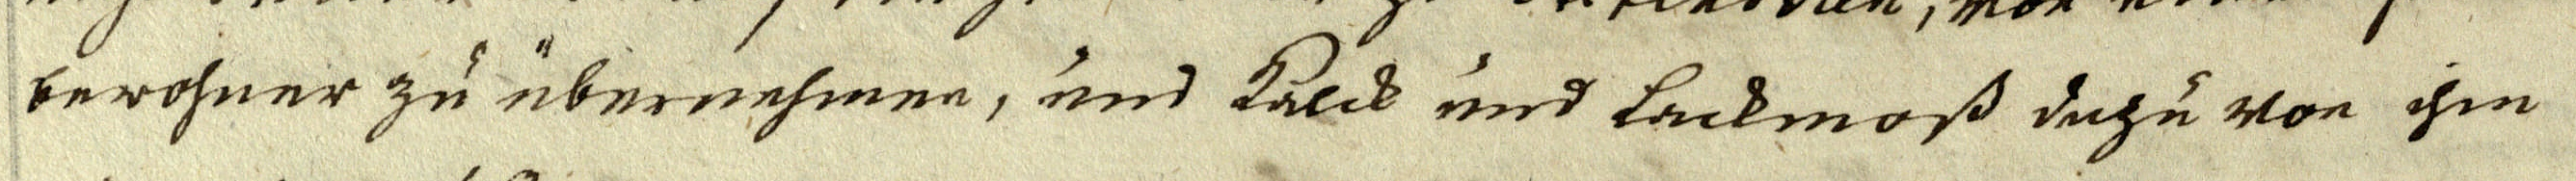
Bewohner zu übernehmen, und Kalck und Lackmoß dazu von ihm
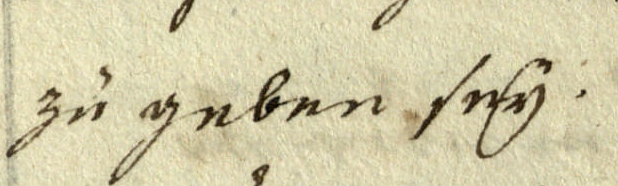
zu geben seÿ.
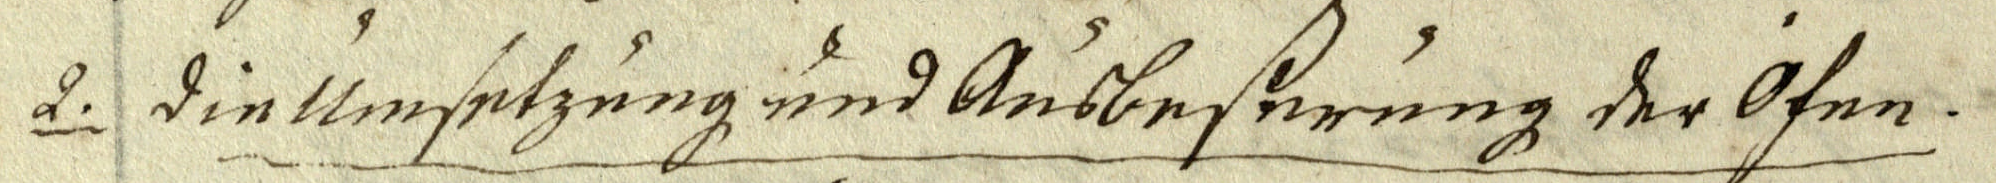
2. die Umsetzung und Ausbeßerung der Öfen
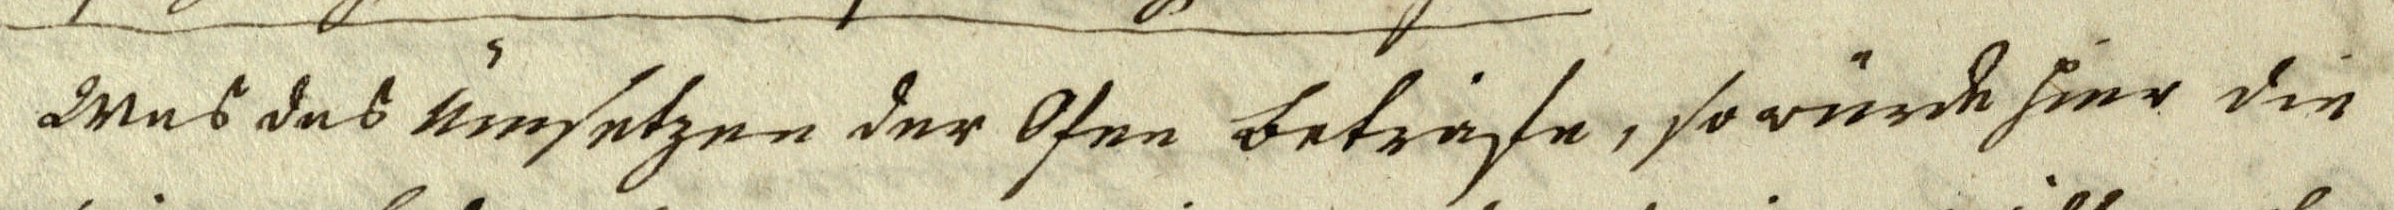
Was das Umsetzen der Ofen beträfe, so würde hier die
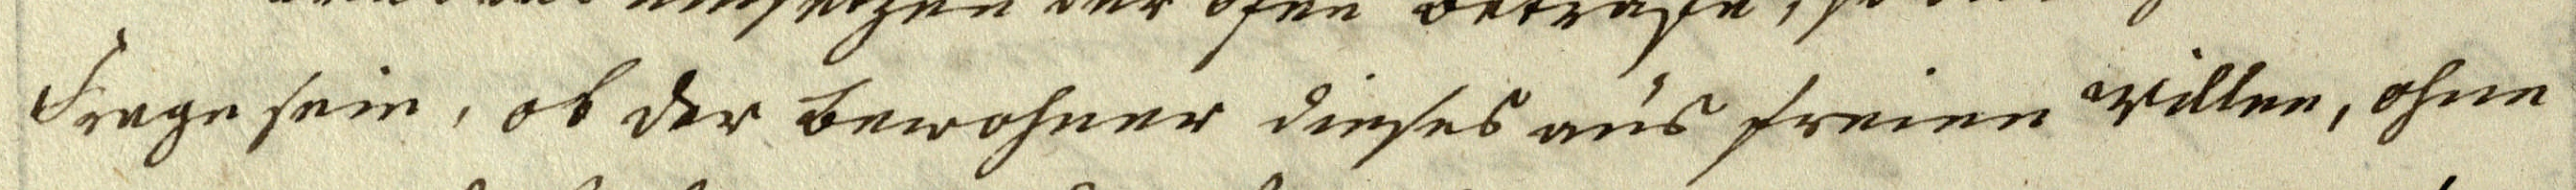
Frage sein, ob der Bewohner dieses aus freien Willen, ohne
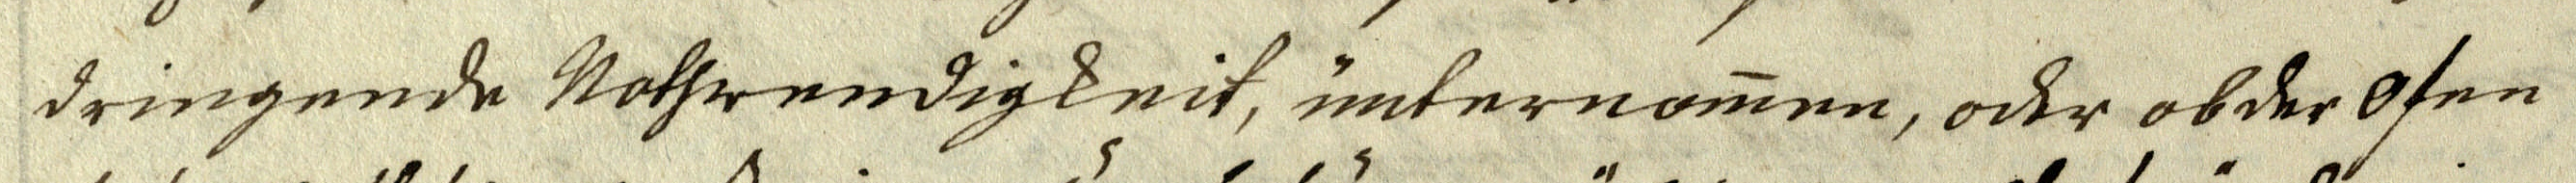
dringende Nothwendigkeit, unternomen, oder ob der Ofen
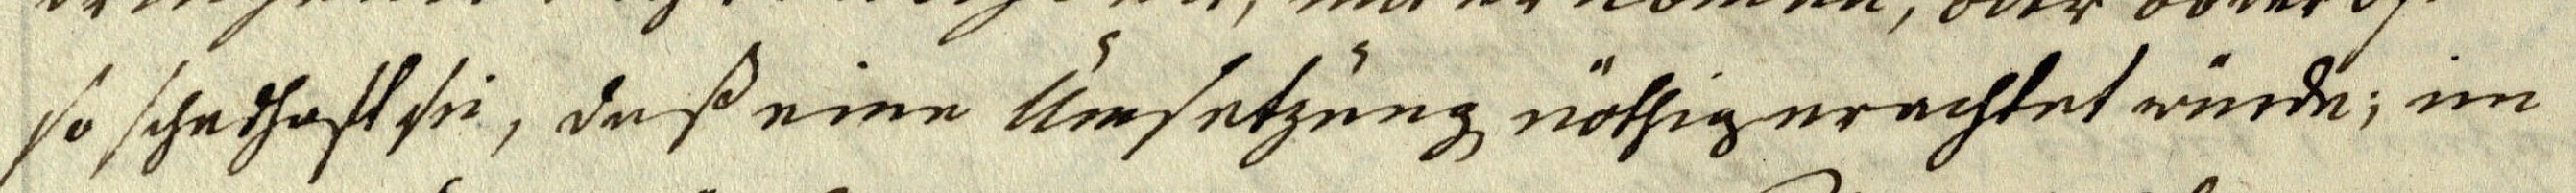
so schadhaft sei, daß eine Umsetzung nöthig erachtet würde; im
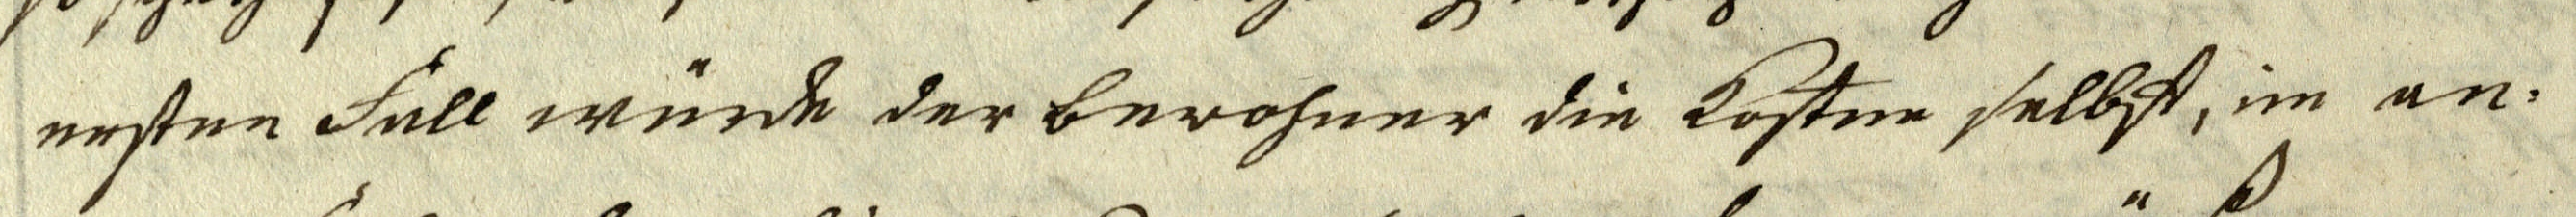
ersten Fall würde der Bewohner die Kosten selbst, im an¬
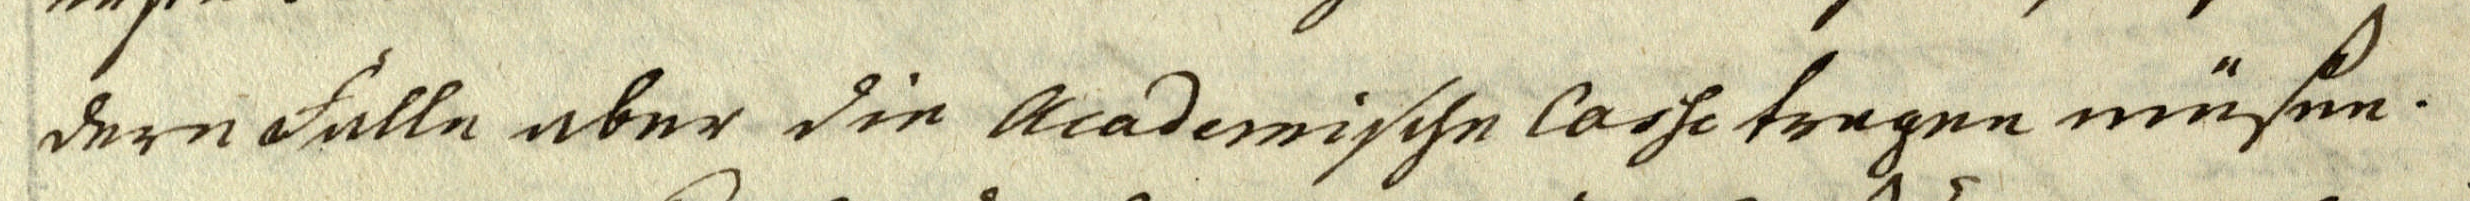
dern Falle aber die Academische Casse tragen müßen.
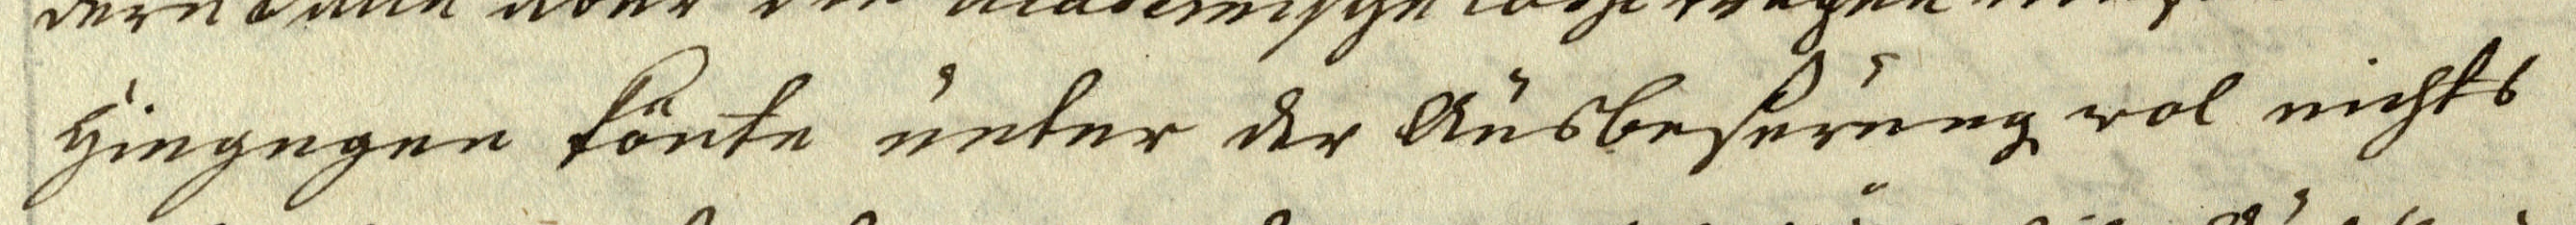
Hingegen könte unter der Ausbeßerung wol nichts
